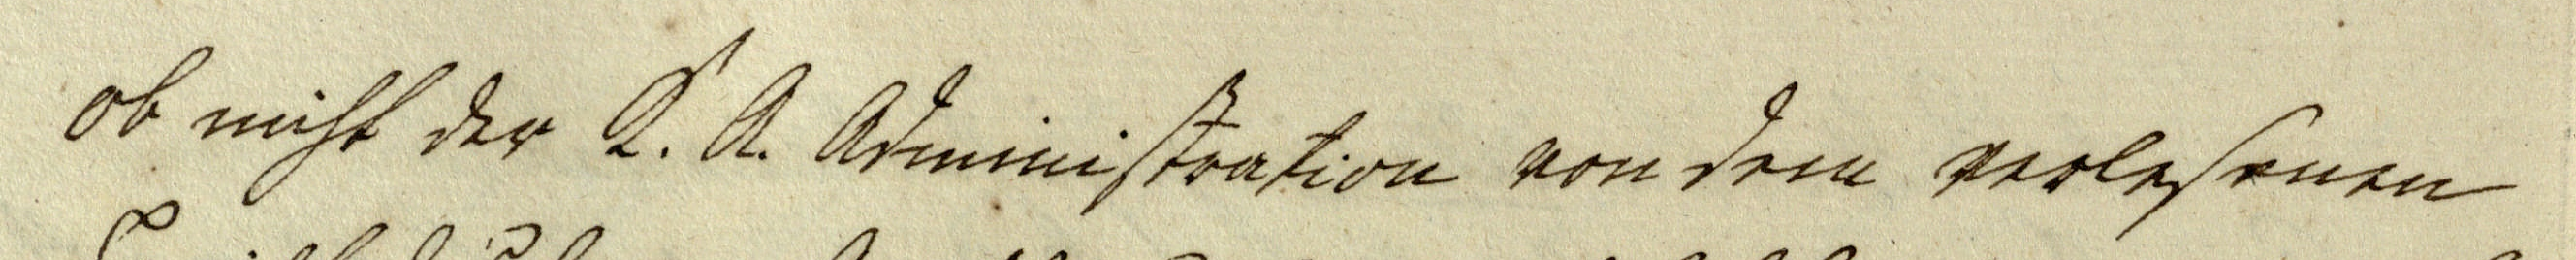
ob nicht der K. A. Administration von dem verlesenen
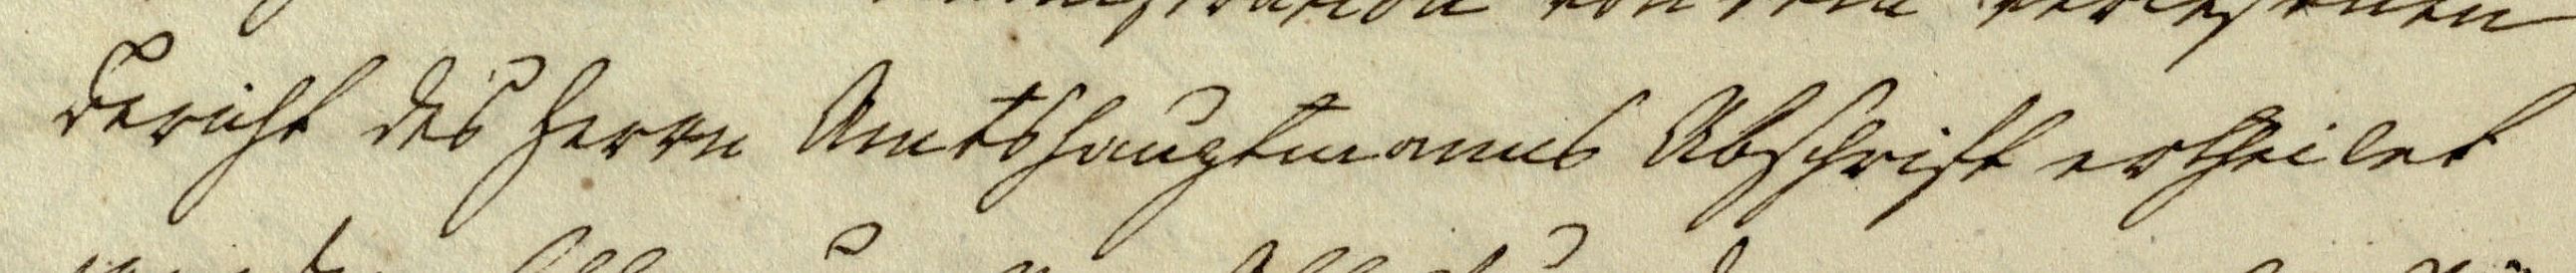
Bericht des Herrn Amtshauptmanns Abschrift ertheilet
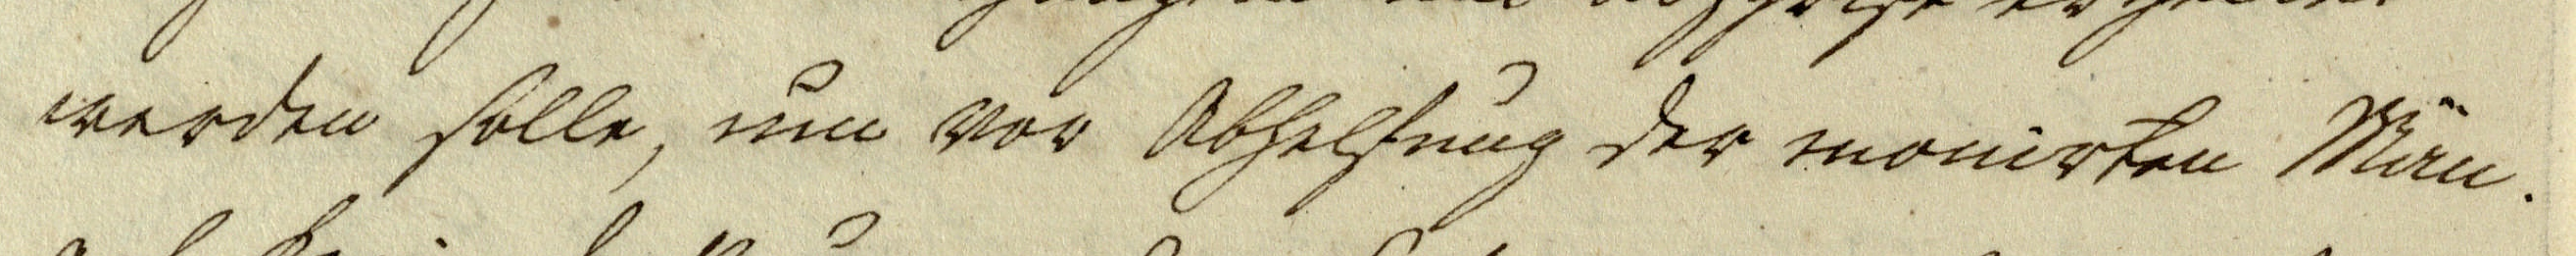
werden solle, um vor Abhelfung der monirten Män¬
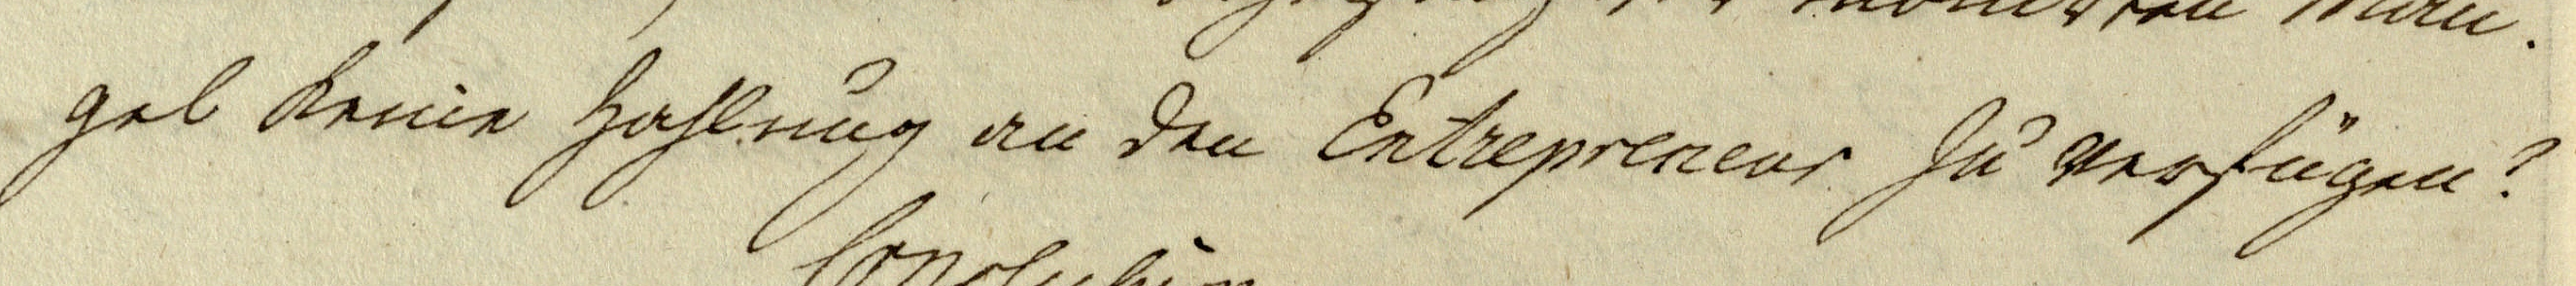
gel keine Zahlung an den Entrepreneur zu verfügen?
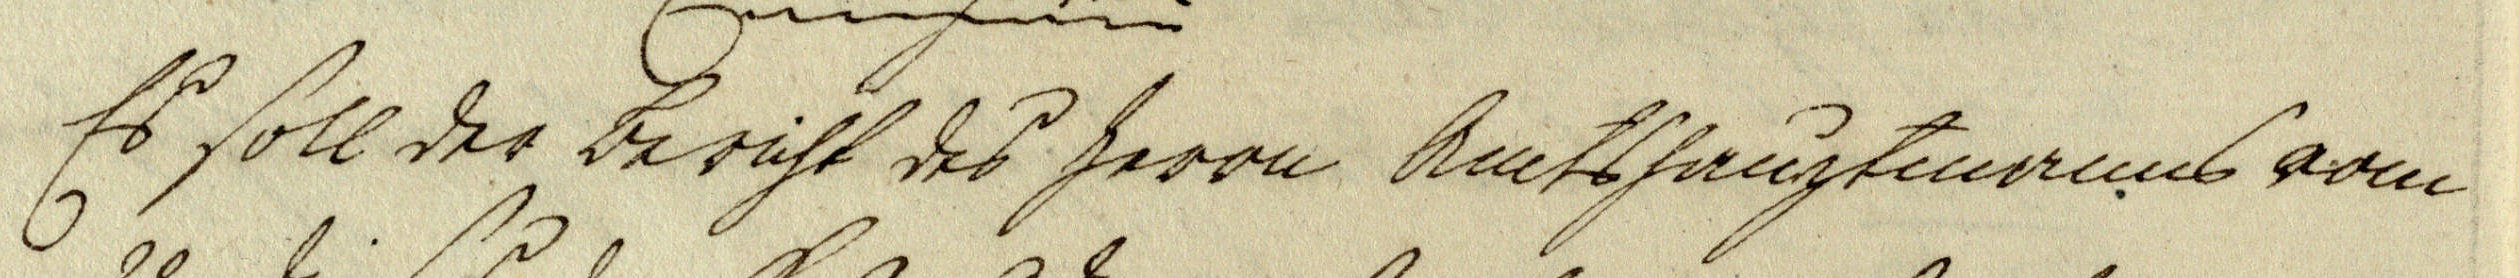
Es soll der Bericht des Herrn Amtshauptmanns vom
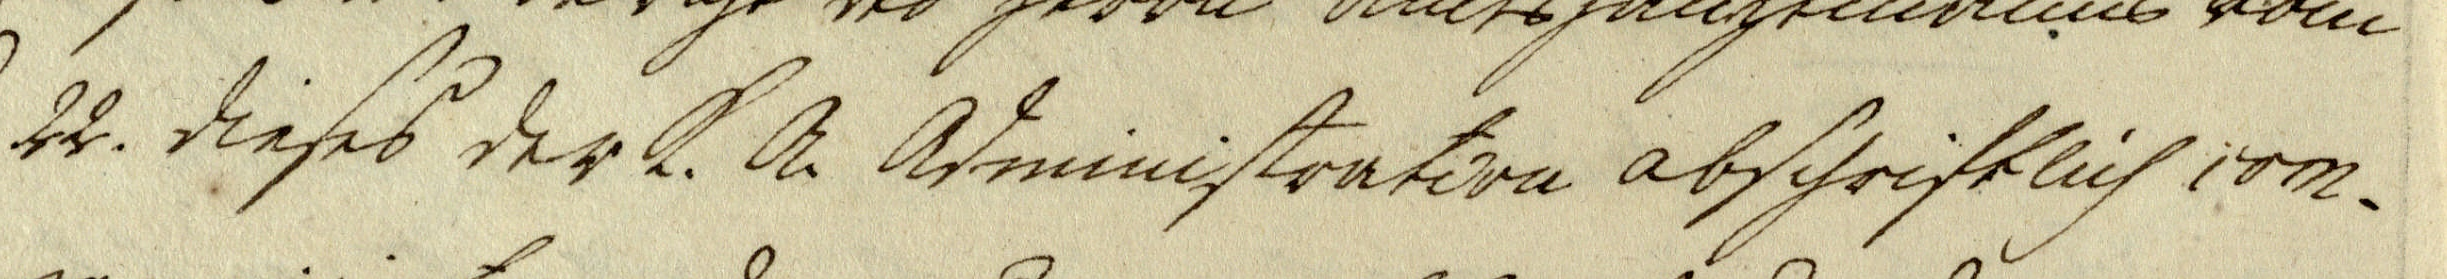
22. dieses der K. A. Administration abschriftlich com¬
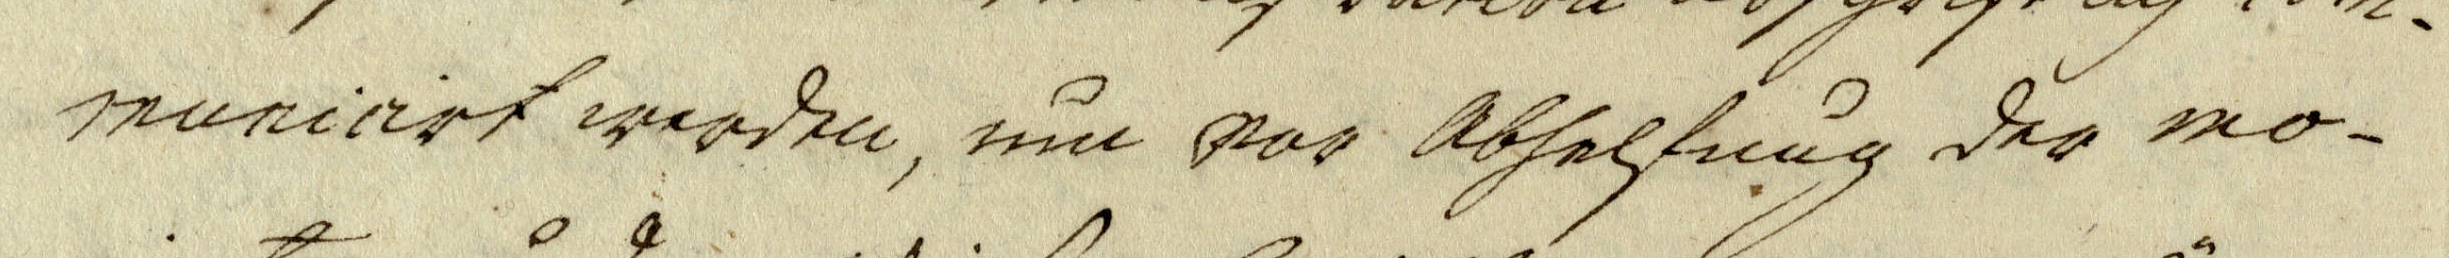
municirt werden, um vor Abhelfung der mo¬
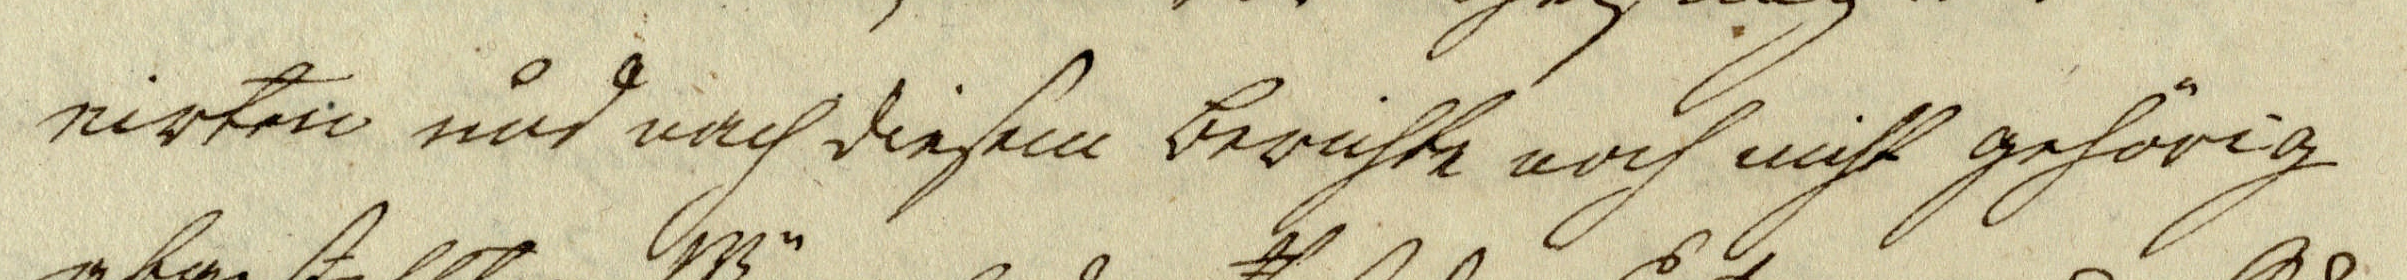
nirten und nach diesem Berichte noch nicht gehörig
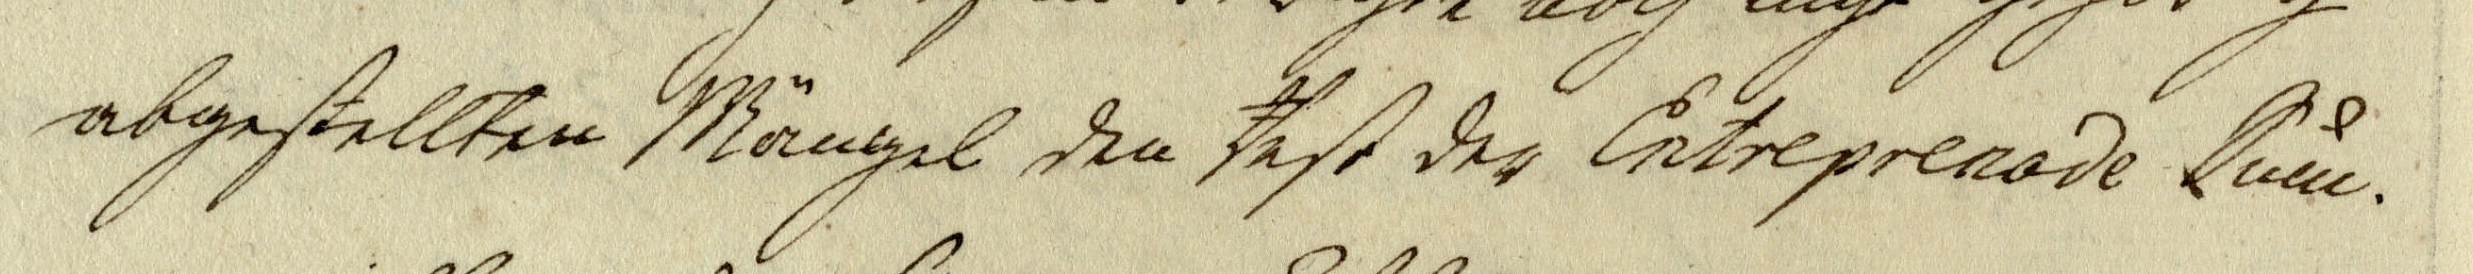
abgestellten Mängel den Rest der Entreprenade Sum¬
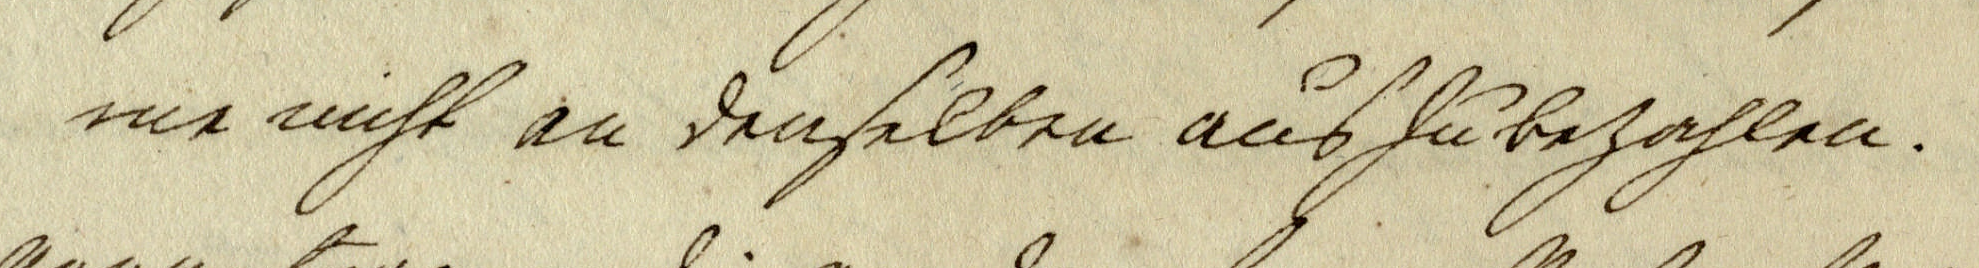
me nicht an denselben auszubezahlen.
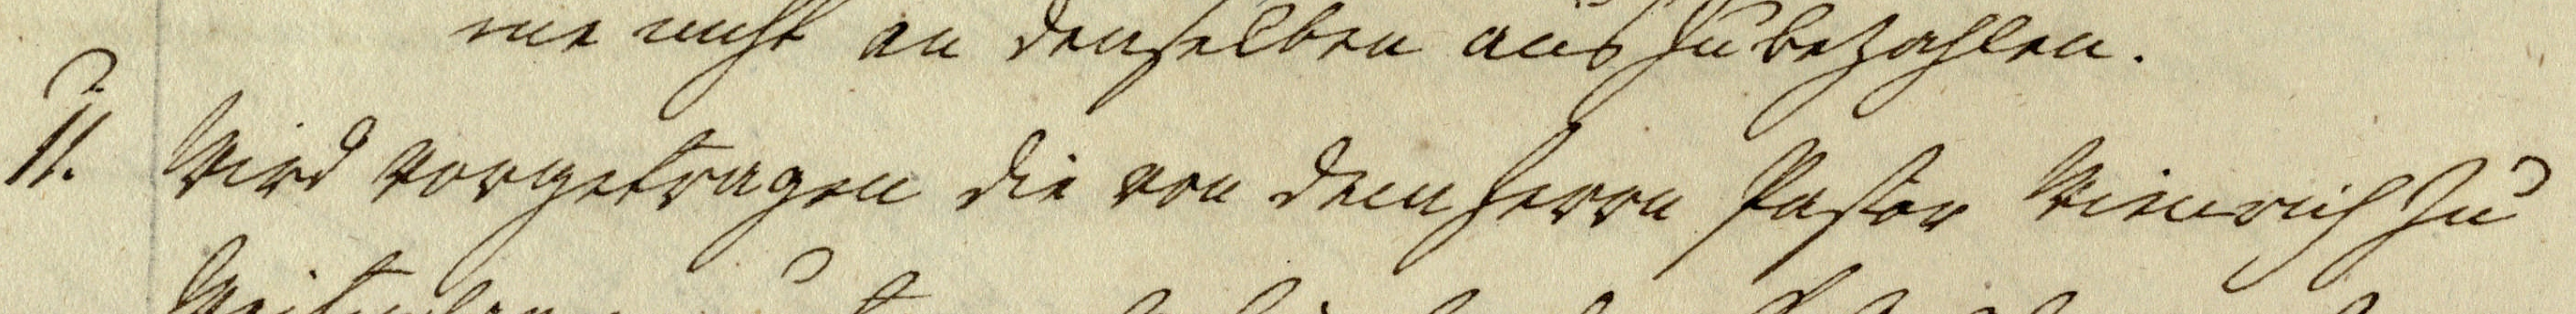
11. Wird vorgetragen die von dem Herrn Pastor Wienrich zu
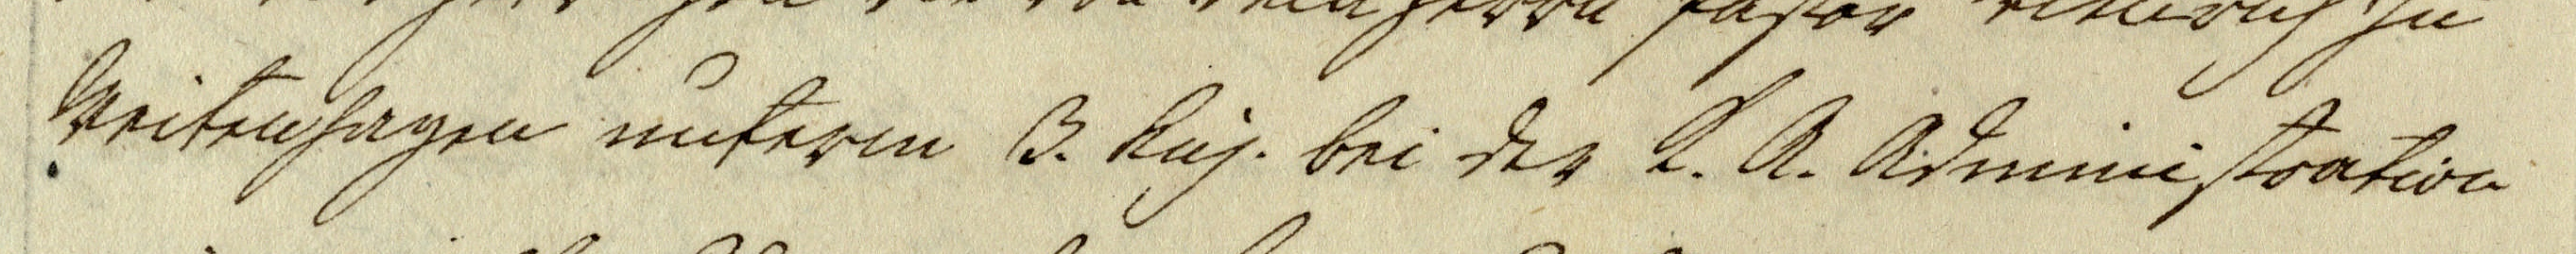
Weitenhagen unterm 3. huj. bei der K. A. Administration
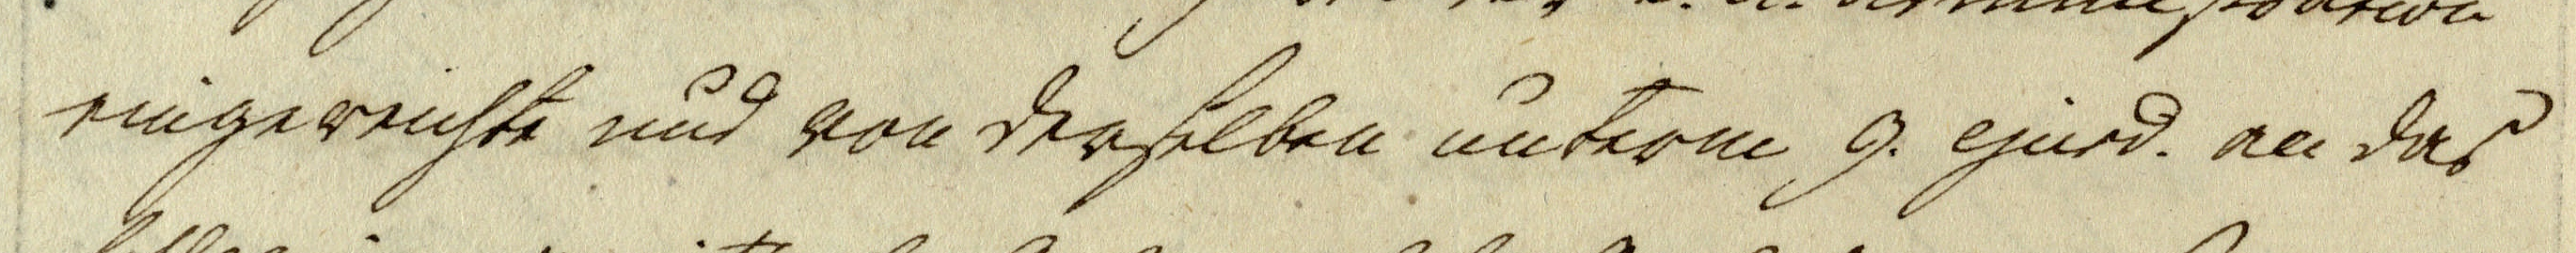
eingereichte und von derselben unterm 9. ejusd. an das
